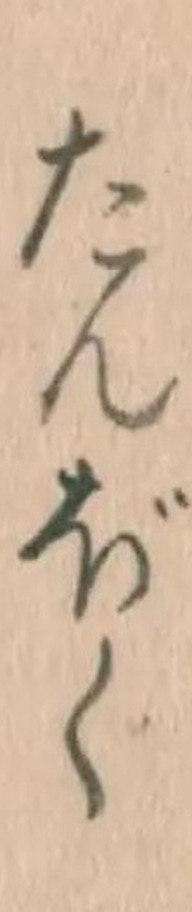たんぼく
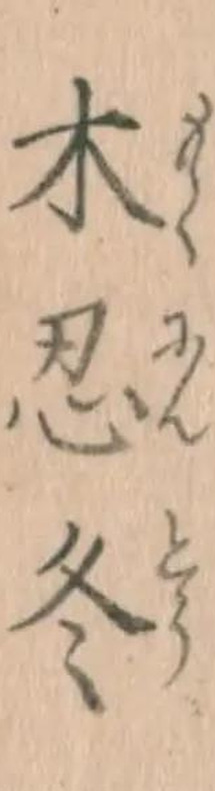木忍冬
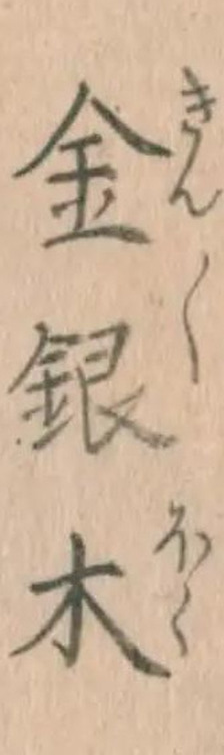金銀木
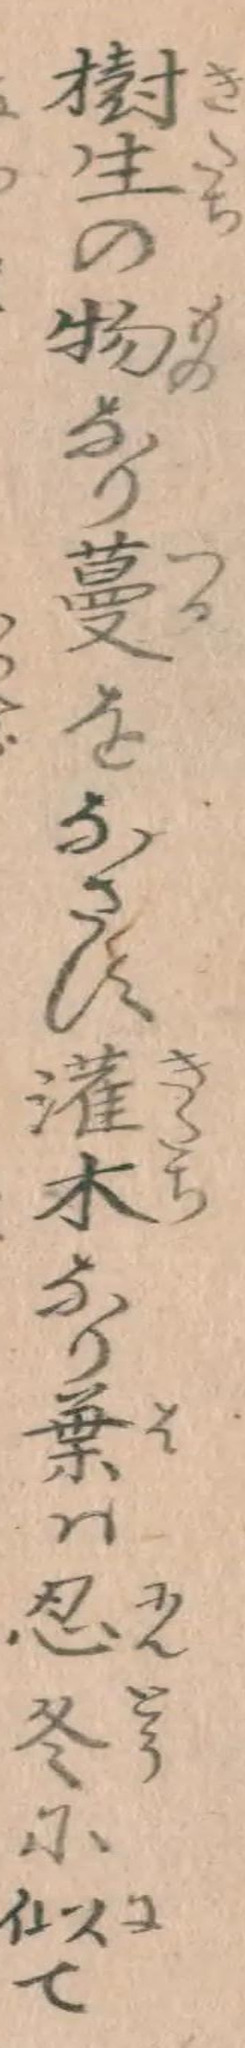樹生の物なり蔓をなさす灌木なり葉は忍冬に似て
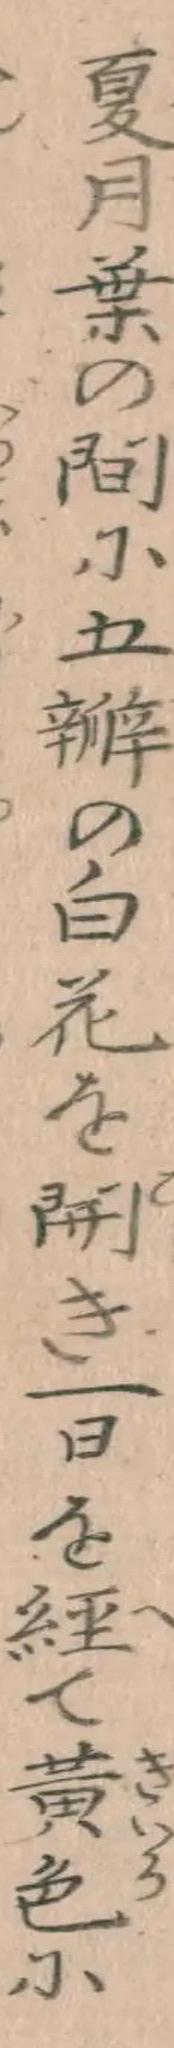夏月葉の間に五弁の白花を開き一日を経て黄色に
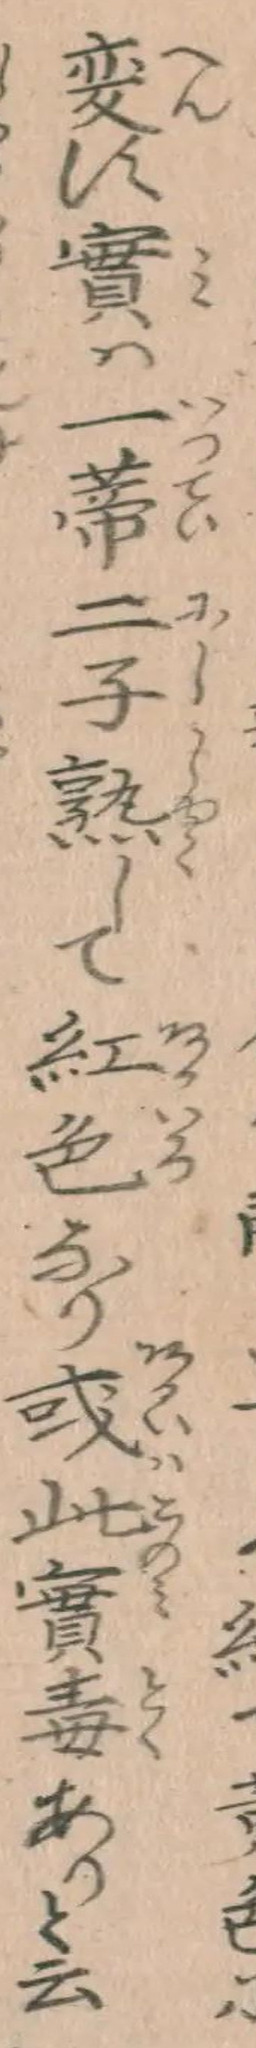変す実は一蒂二子熟して紅色なり或此実毒ありと云
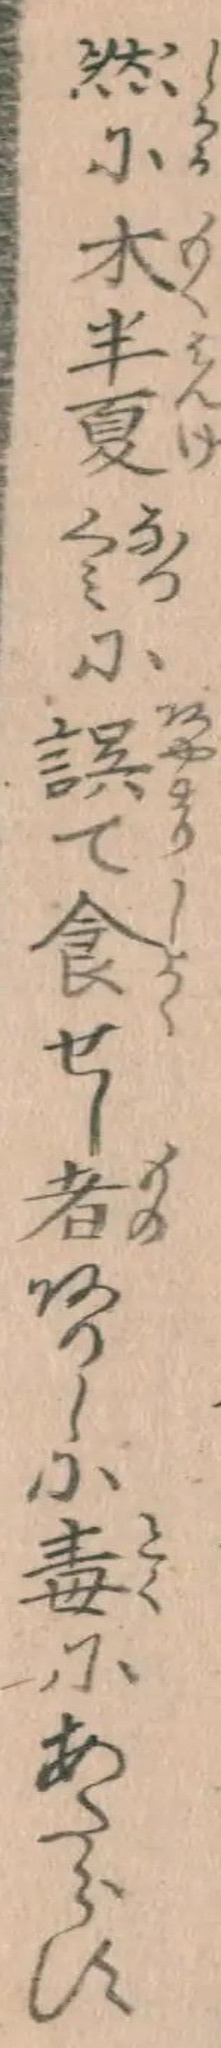然に木半夏なつくみに誤て食せし者ありしに毒にあたらす
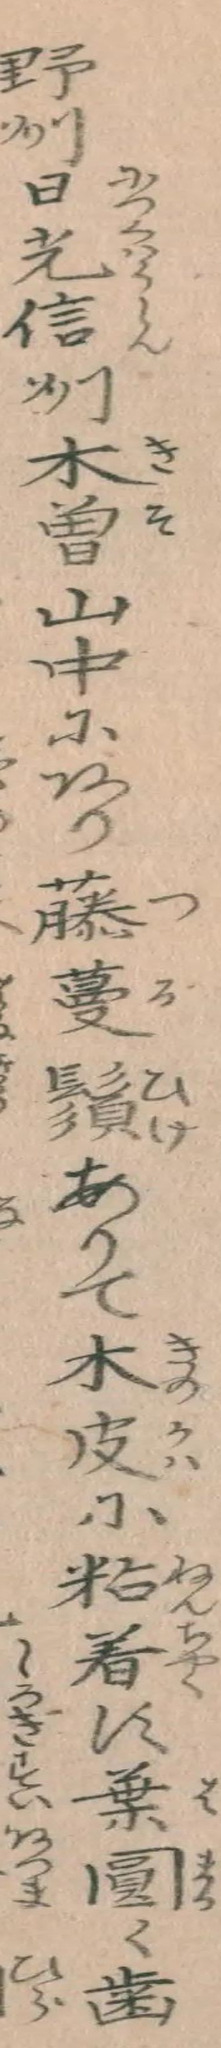野州日光信州木曽山中にあり藤蔓鬚ありて木皮に粘着す葉円く歯
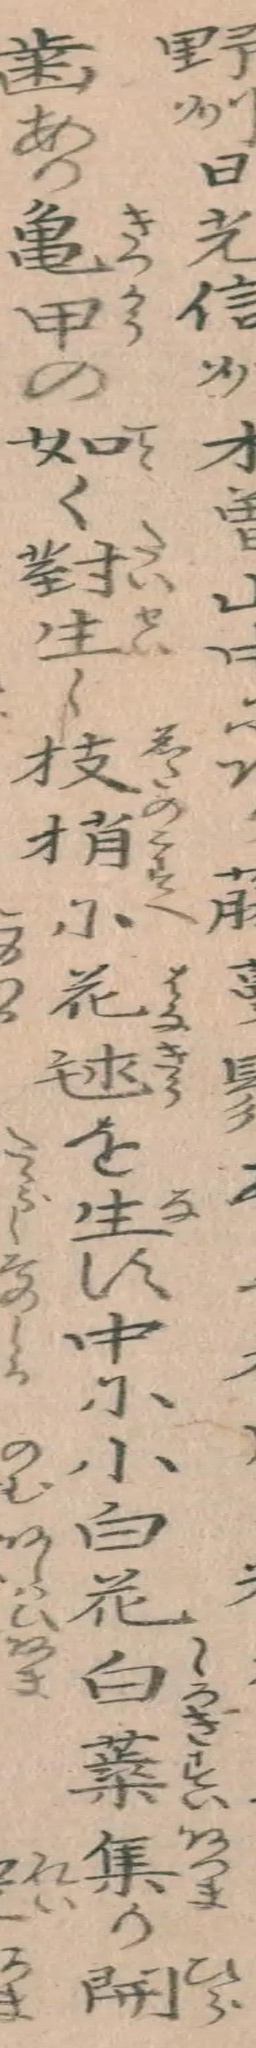歯あり亀甲の如く対生し枝梢に花毬を生す中に小白花白蕊集り開
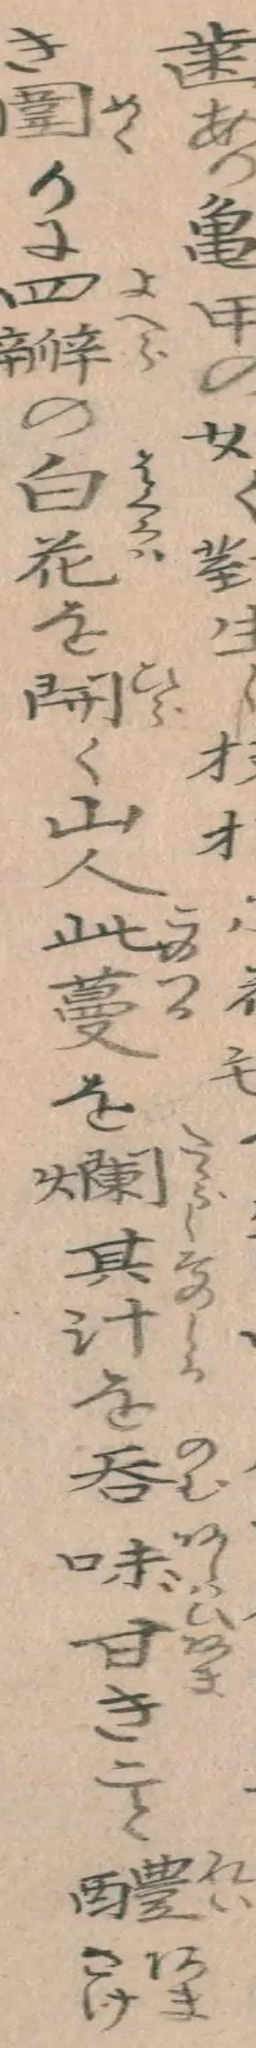き囲りに四弁の白花を開く山人此蔓を爛其汁を呑味甘きこと醴あまさけ
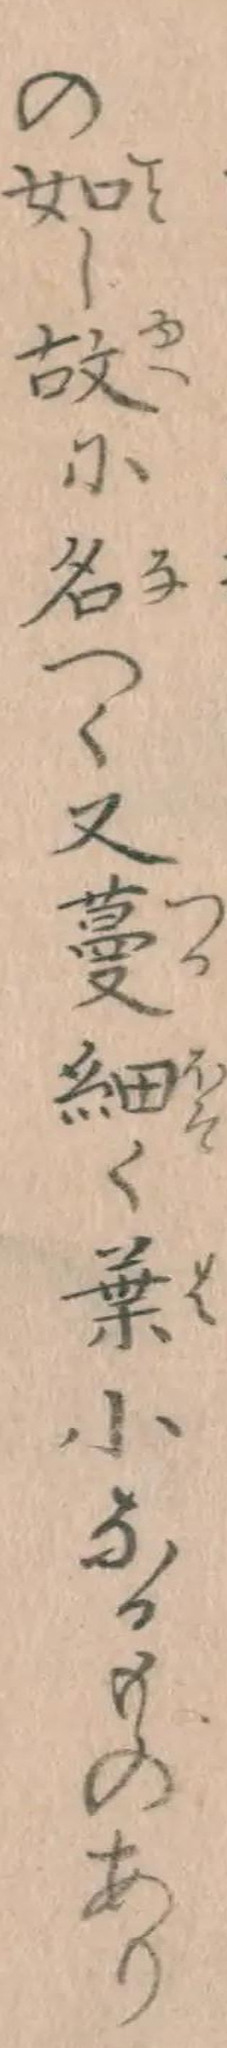の如し故に名つく又蔓細く葉小なるものあり
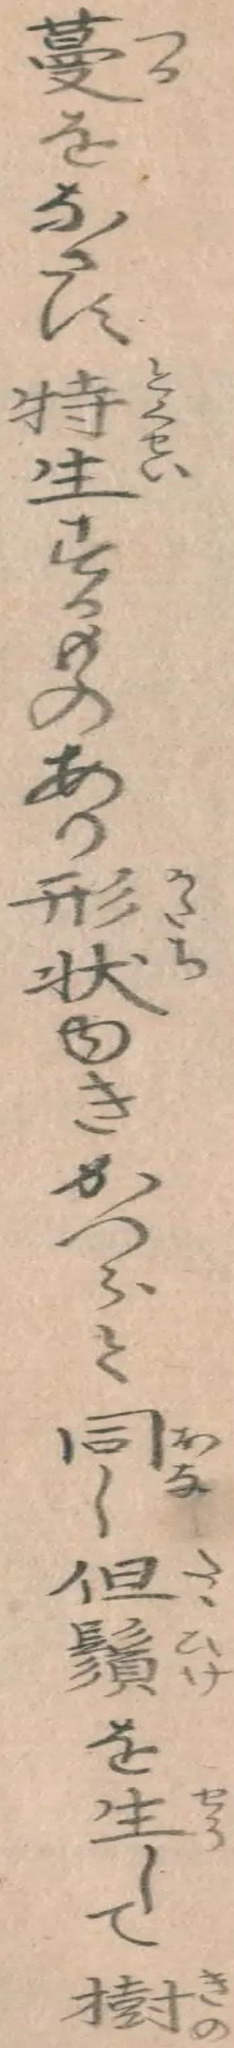蔓をなさす特生するものあり形状ゆきかつらと同し但鬚を生して樹
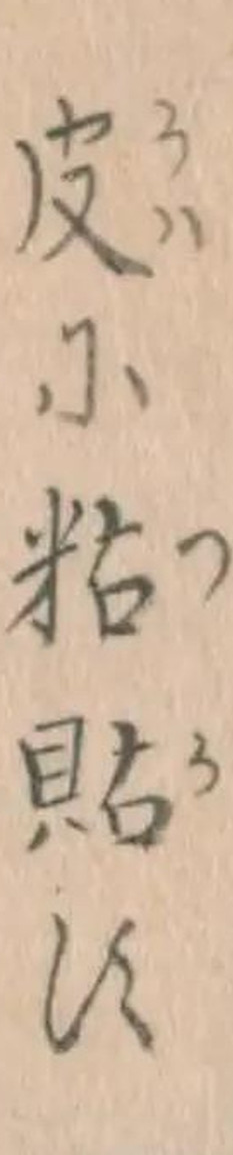皮に粘貼す

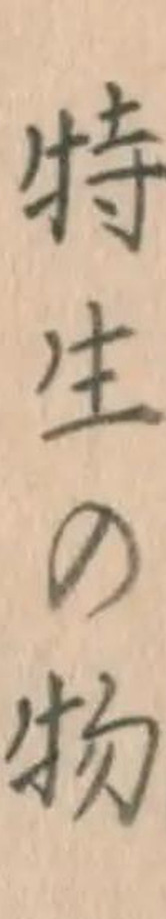特生の物
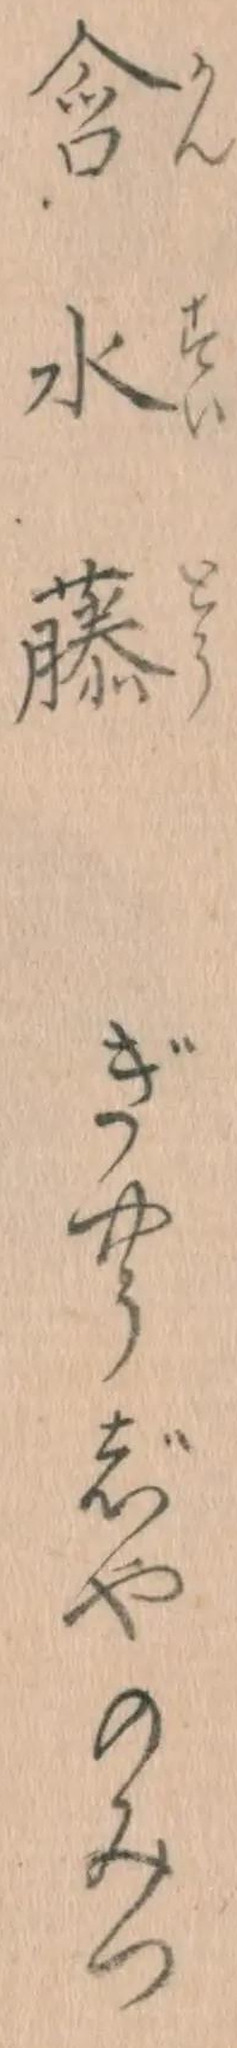含水藤ぎやうじやのみつ
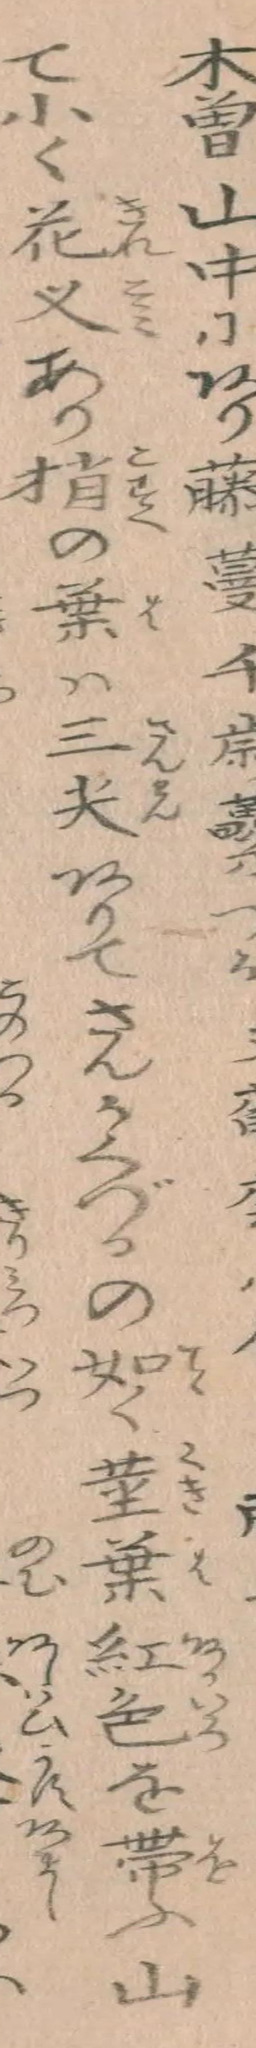て小く花叉あり梢の葉は三尖ありてさんかくづるの如く茎葉紅色を帯ふ山
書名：本草図譜. 巻31-33
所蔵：国立国会図書館 National Diet Library, JAPAN
